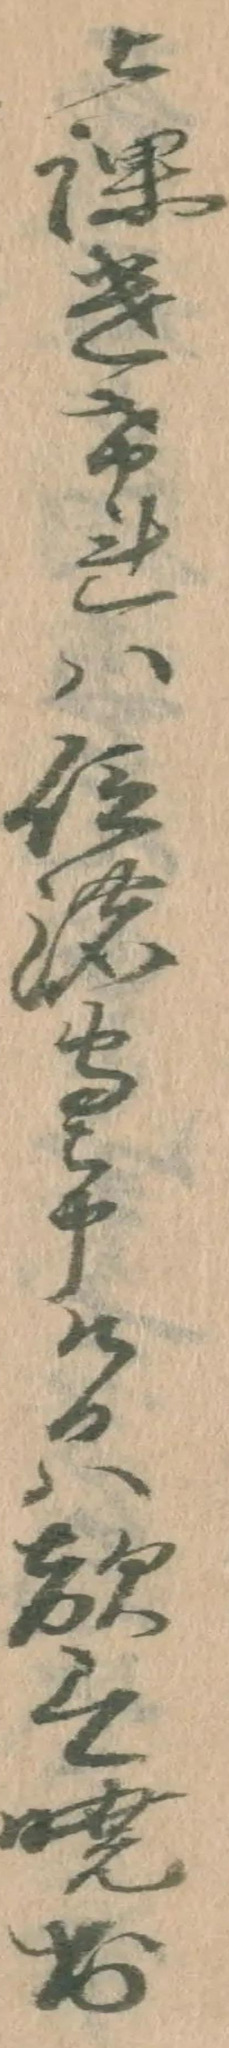被課遣希連は信濃守被申けるは敵今晩出
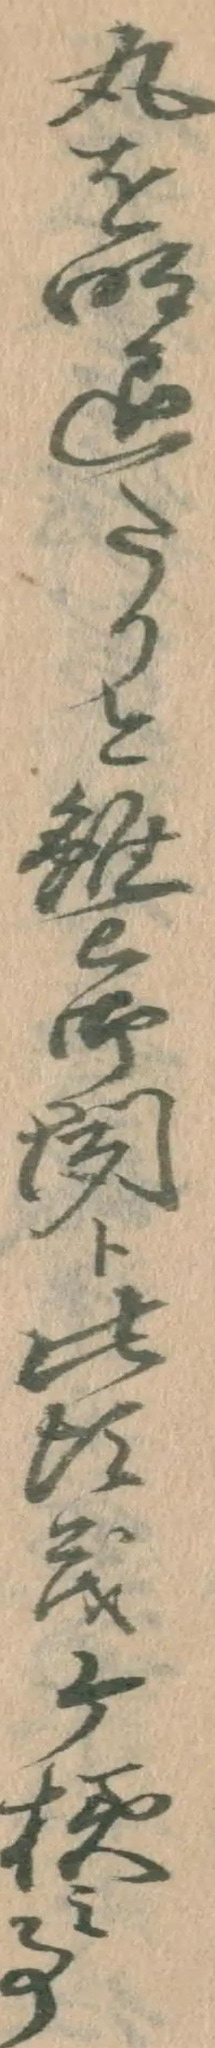丸を明退たりと雖被御聞と此頃茂け様之事
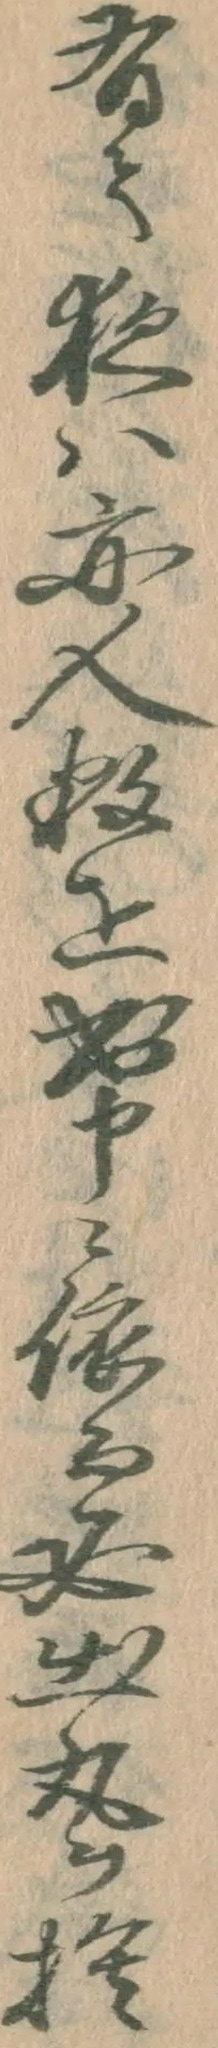有て夜は亦人数を出申に依而必出丸を捨
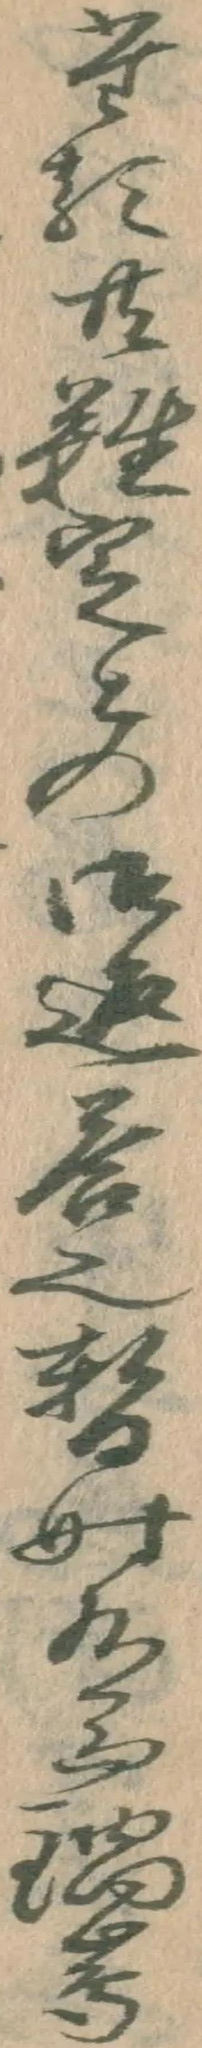堂類共難定との御返答也暫時有而鍋島
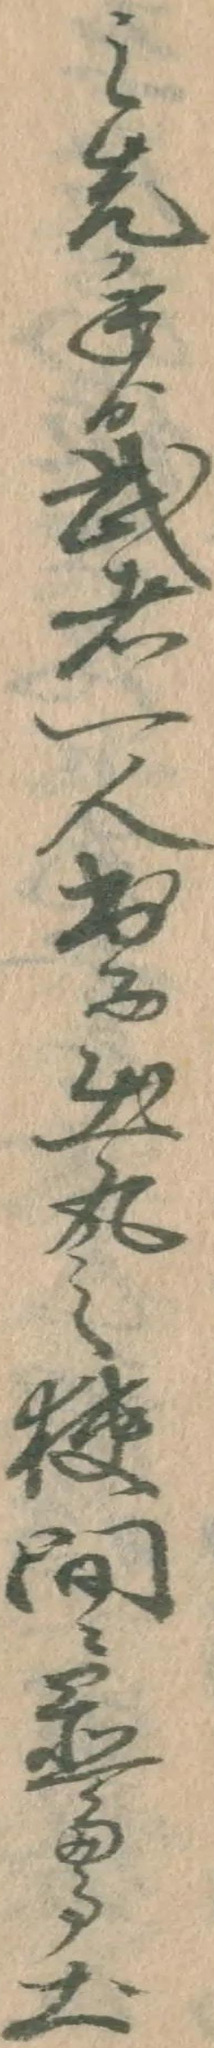之先手ゟ武者一人出而出丸之狭間に置多る土
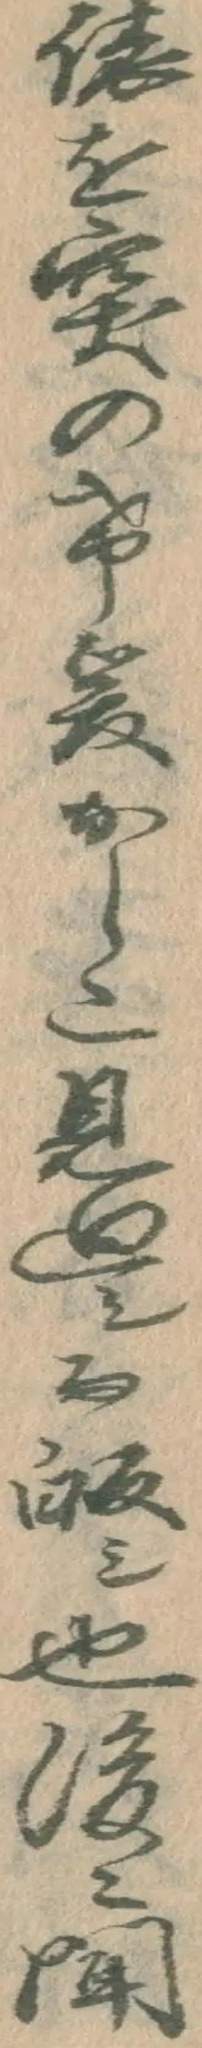俵を突の希爰かしこ見廻し而皈し也後に聞
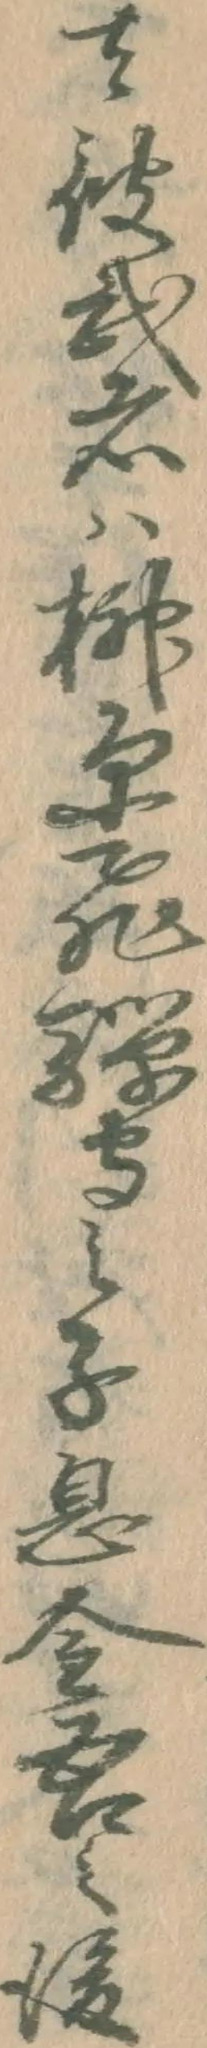者彼武者は榊原飛騨守之子息金吾之後
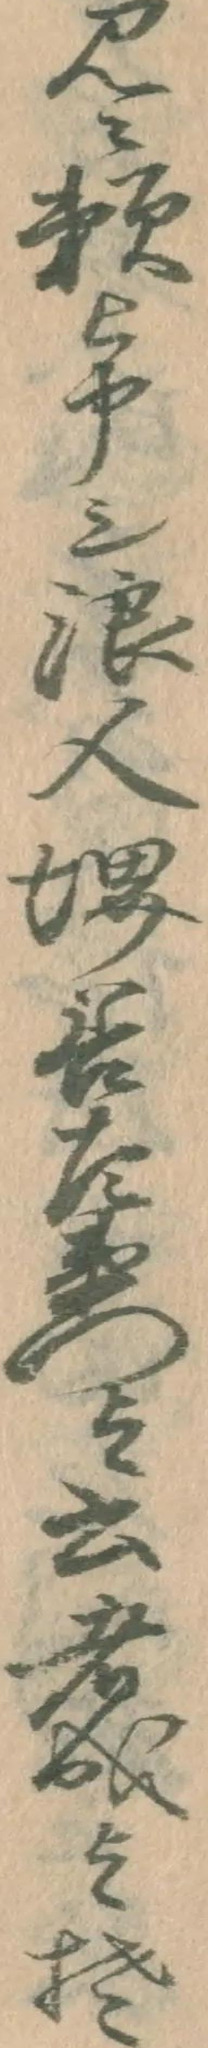見に頼被申し浪人堺善左衛門与云者成与楚

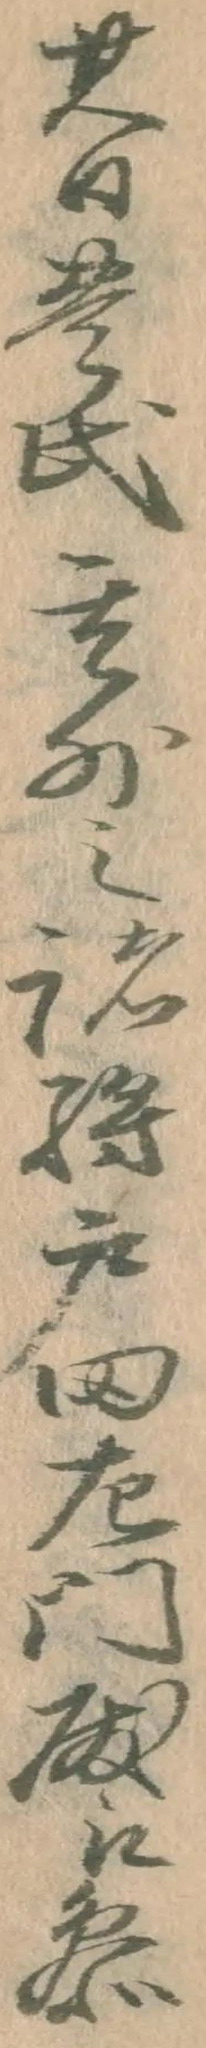其日豊氏其外之諸将戸田左門殿江参
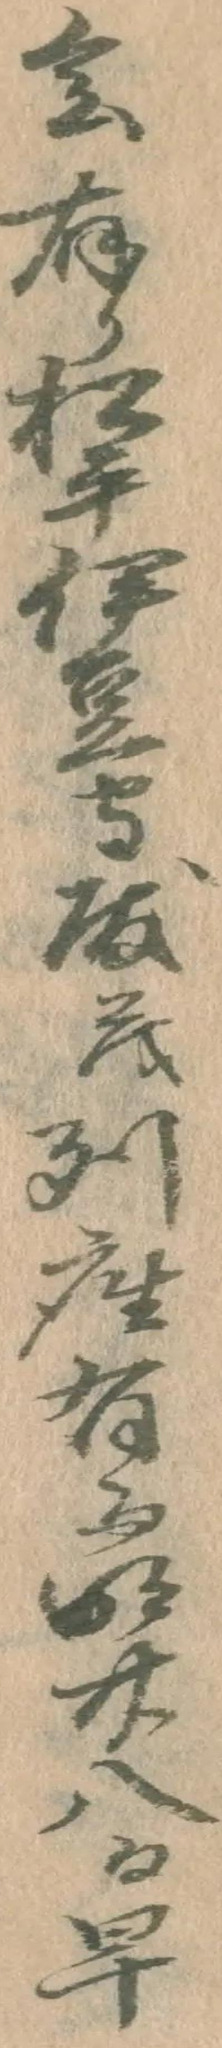会有り松平伊豆守殿茂列座有而明廿八日早
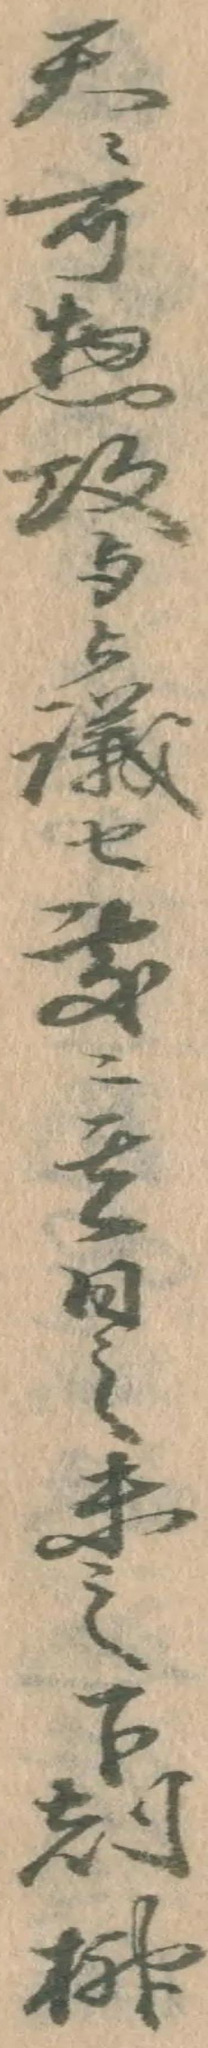天に可惣攻与被議せ處に其日之未之下刻榊
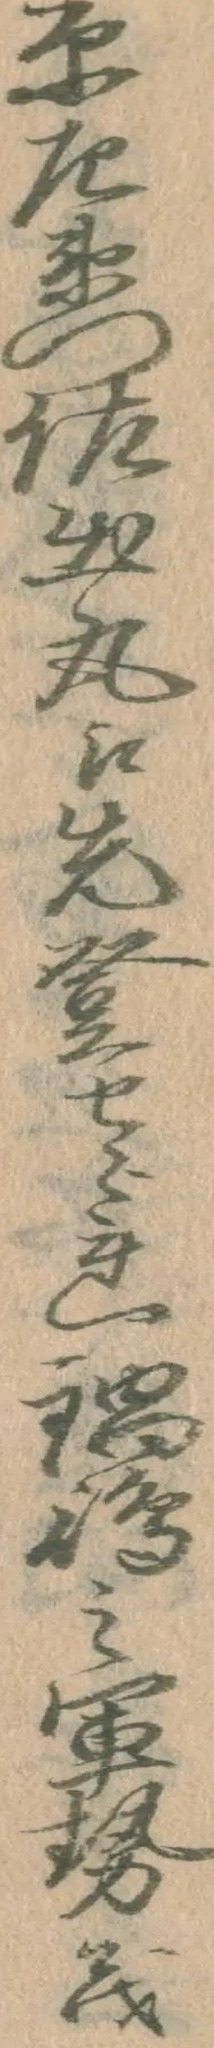原左衛門佐出丸江先登せら連鍋島之軍勢茂
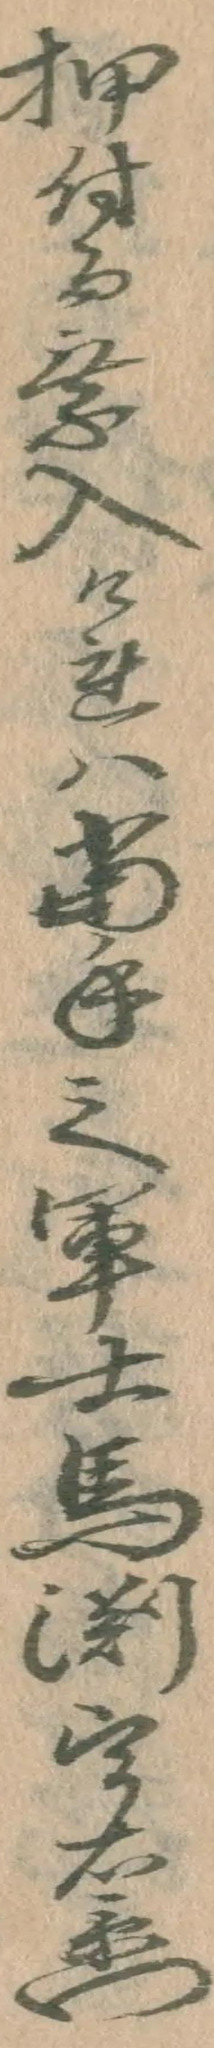押付而乗入け連は当手之軍士馬渕宇右衛門
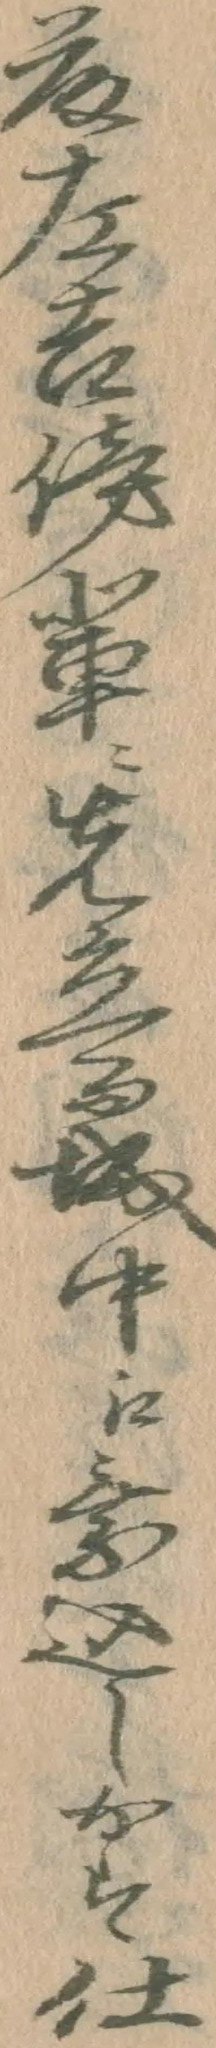藤左吉傍輩に先立而城中江乗込しか春仕
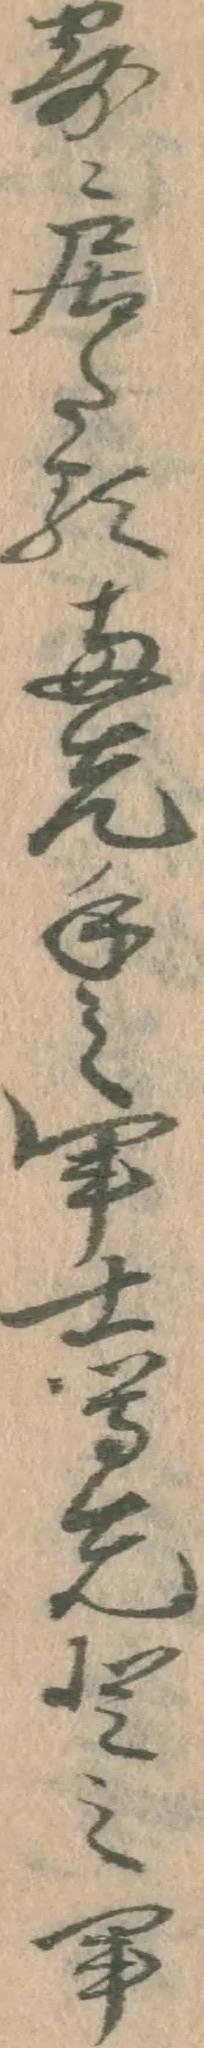寄に居た類両先手之軍士等先登之軍
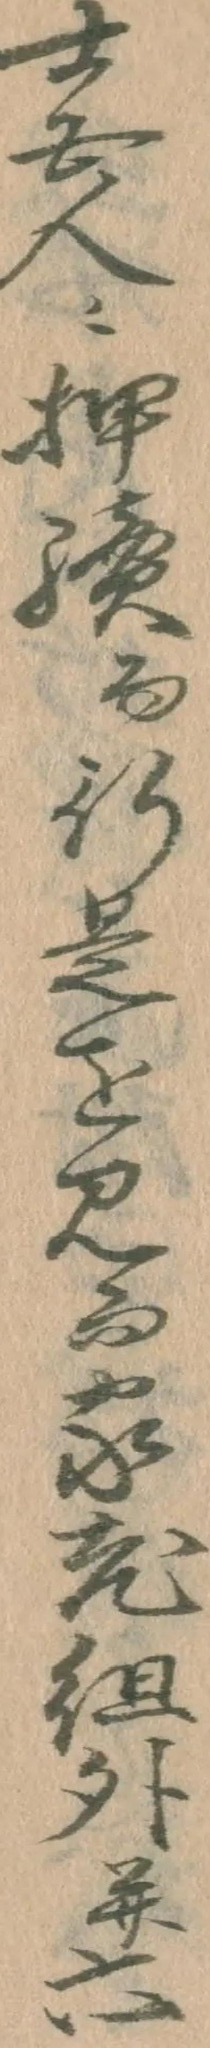士五人に押続而行是を見而家老組外幷六
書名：切支丹御退治記 49巻. [8]
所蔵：国立国会図書館 National Diet Library, JAPAN
